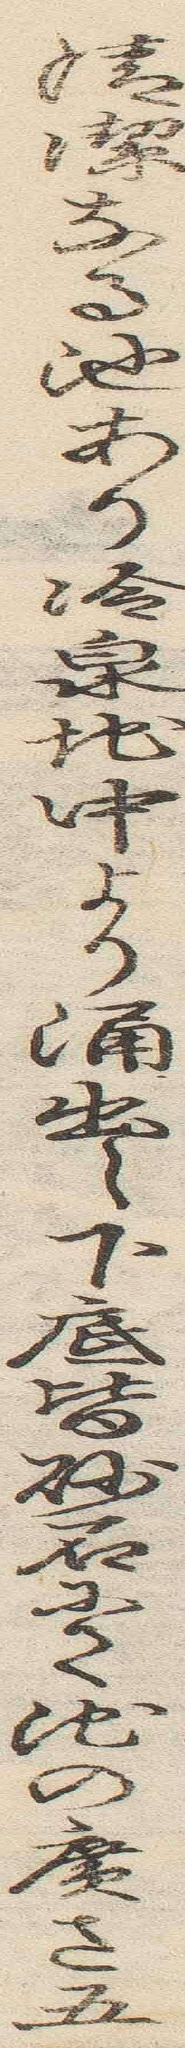清潔なる池あり冷泉地中より涌出し下底皆砂石にて池の廣さ五
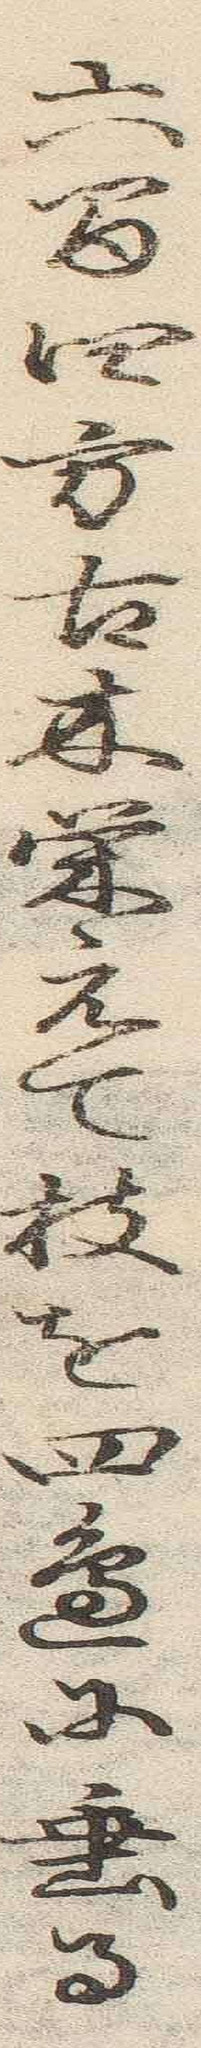六間四方古木栄えて枝を四邊に垂る
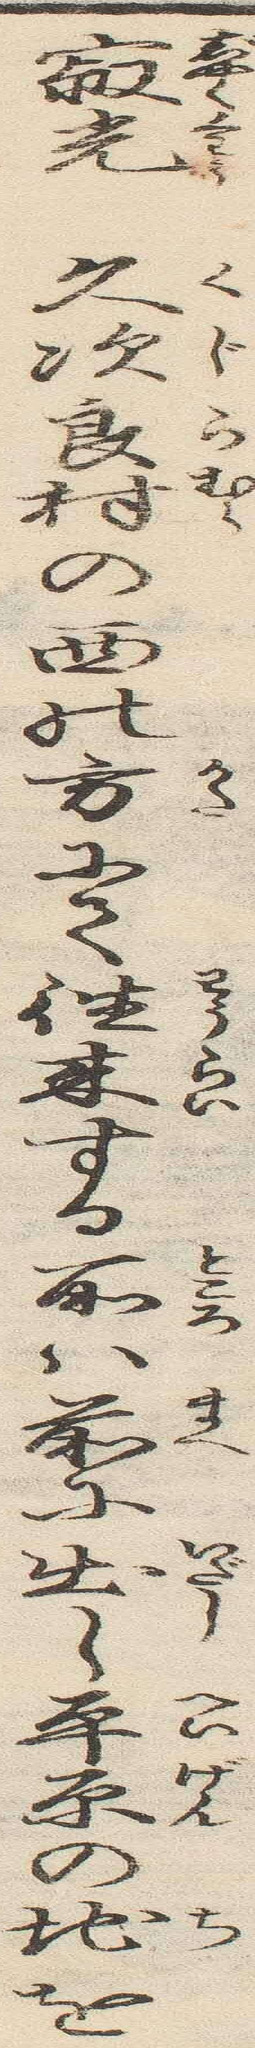寂光久次良村の西の方にて徃來する所は前に出し平原の地を
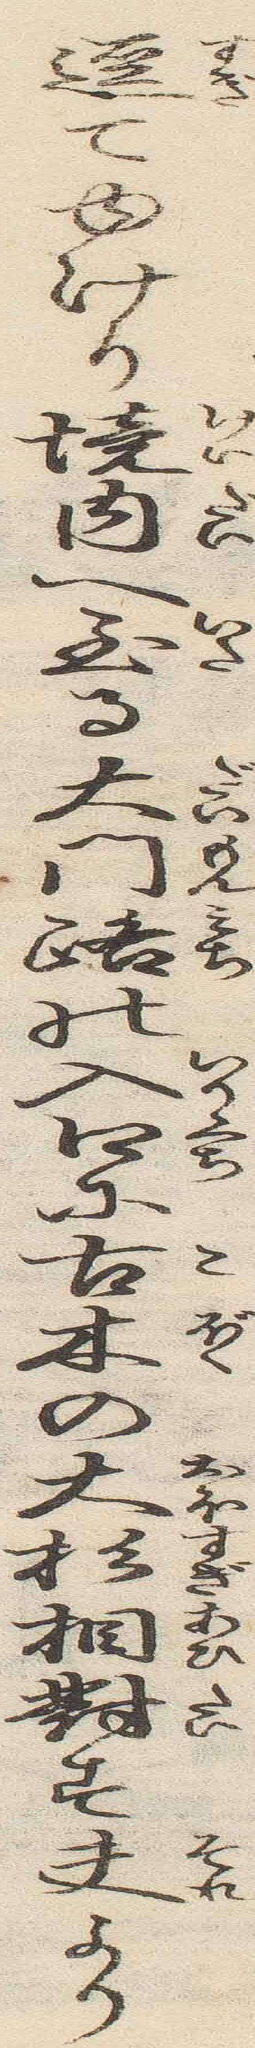逕てゆけり境内へ至る大門路の入口に古木の大杉相對す夫より
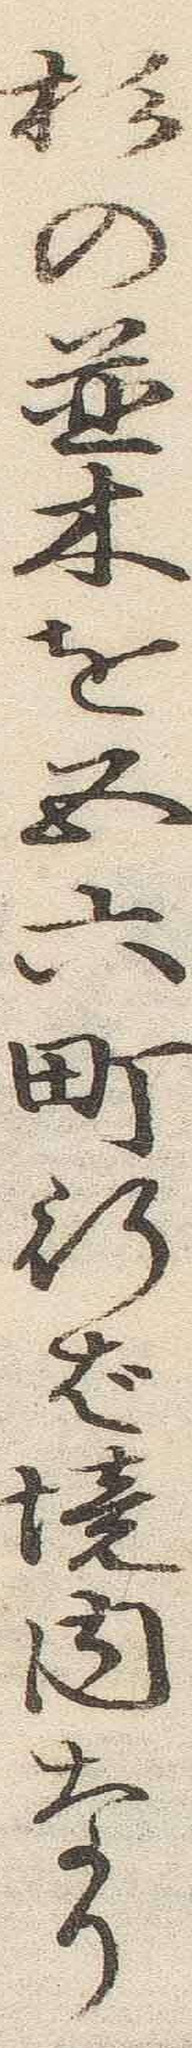杉の並木を五六町行ば境内なり
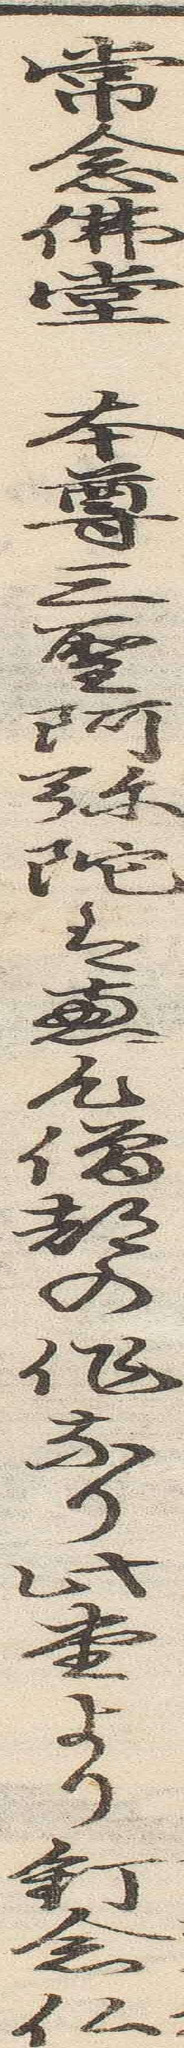常念佛堂本尊三聖阿弥陀は恵心僧都の作なり此堂より釘念仏
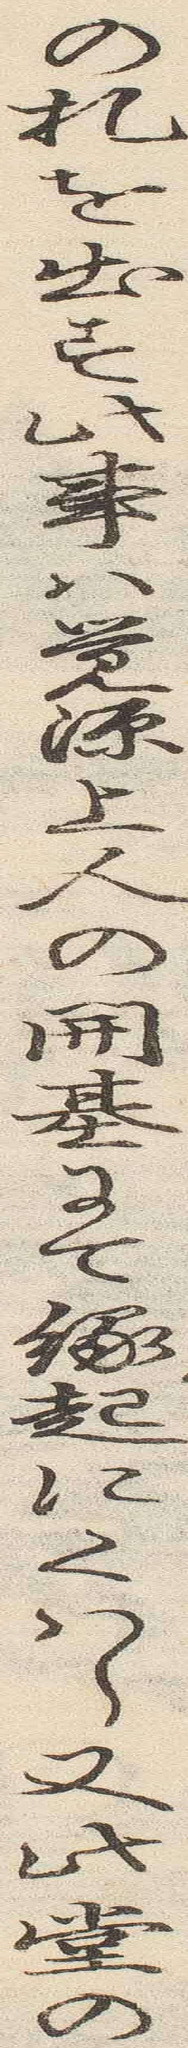の札を出す此事は覚源上人の開基にて縁起にくはし又此堂の
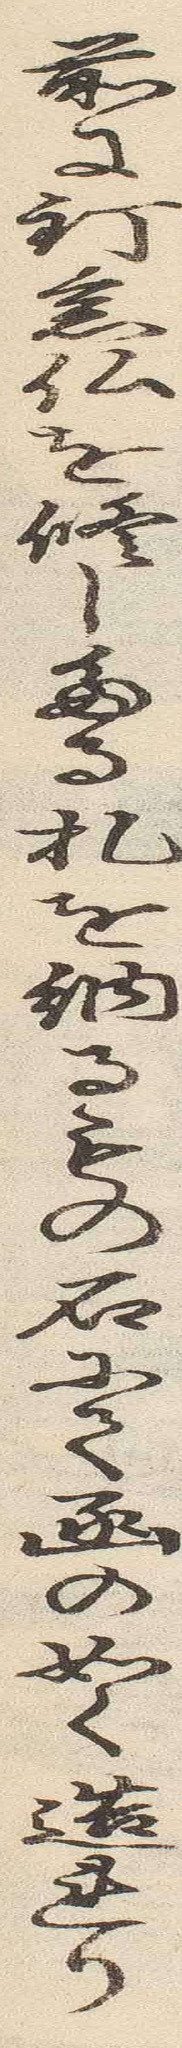前に釘念仏を修したる札を納るもの石にて凾の如く造れり
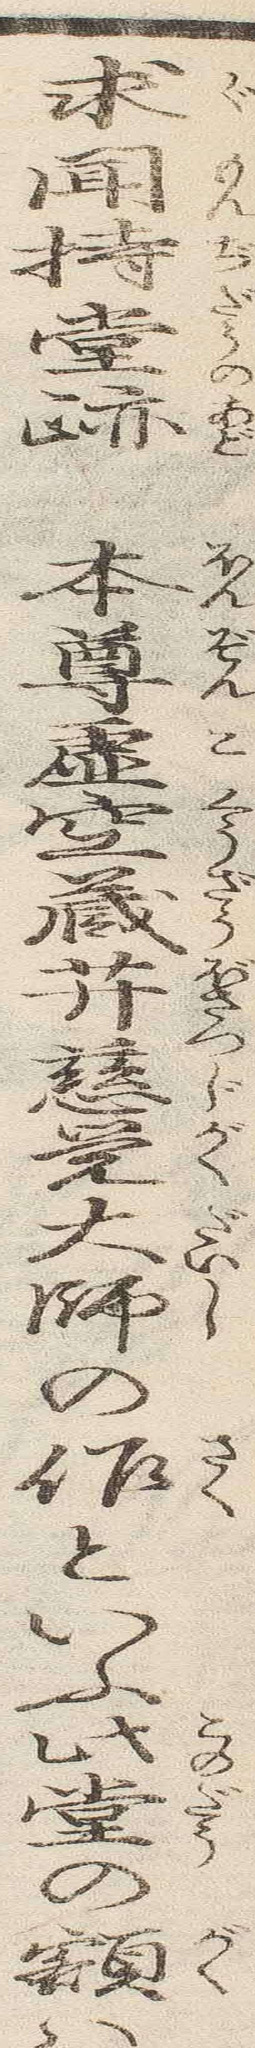求聞持堂跡本尊虚空蔵𦬇慈覚大師の作といふ此堂の額は
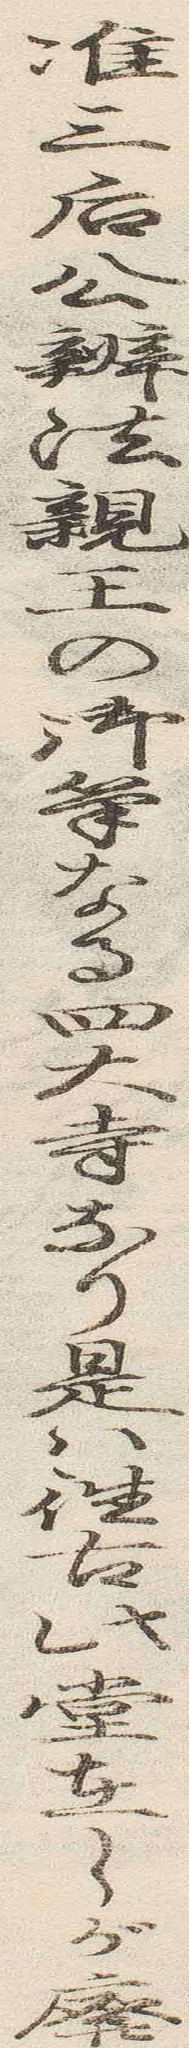准三后公辨法親王の御筆なる四大寺なり是は徃古此堂在しが廃
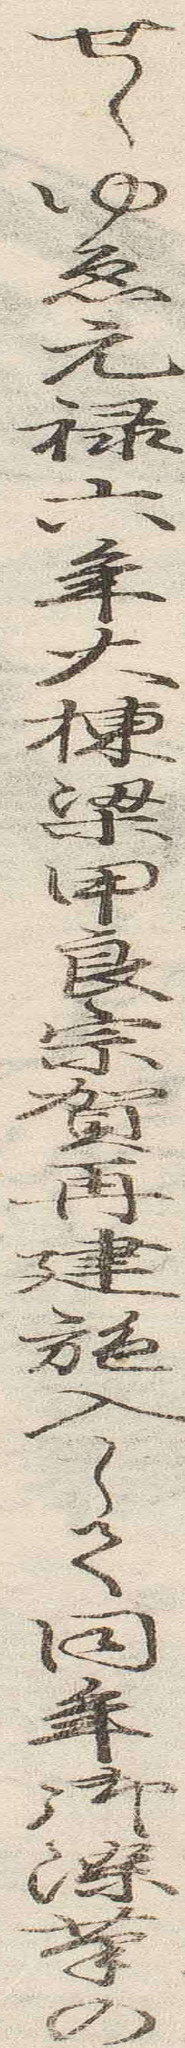せしゆゑ元禄六年大棟梁甲良宗賀再建施入して同年御染筆の
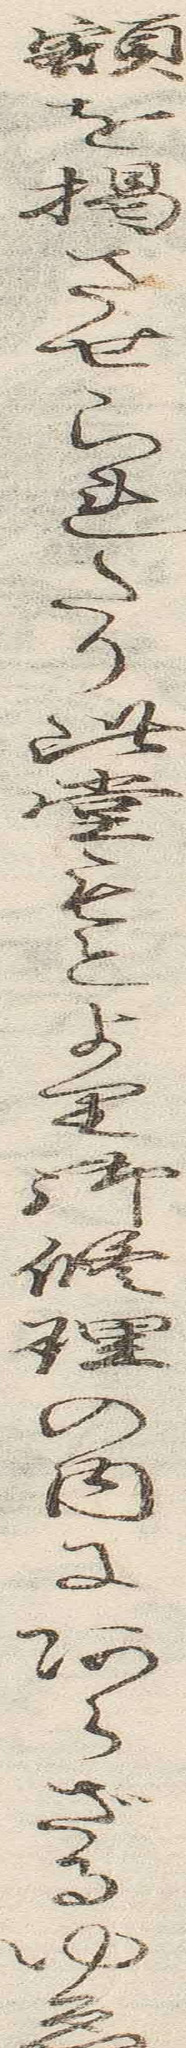額を掲させられたり此堂もとより御修理の内にあらざるゆゑ
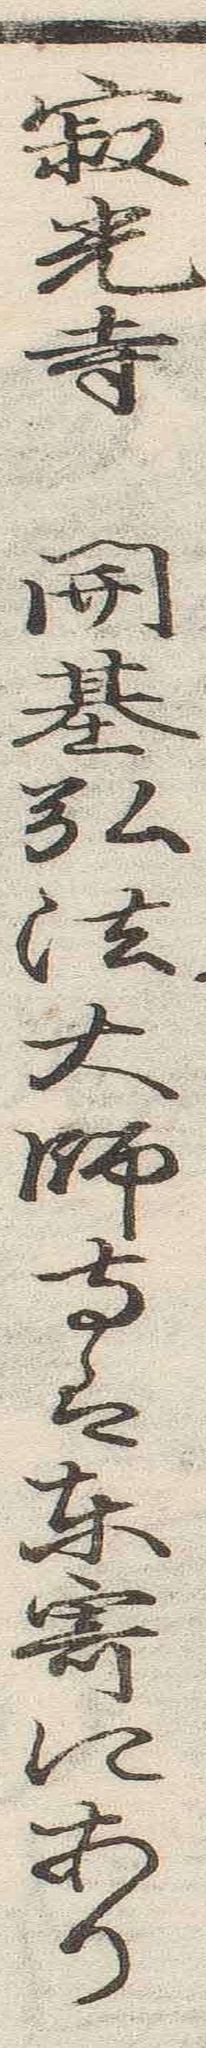寂光寺開基弘法大師寺は東寄にあり
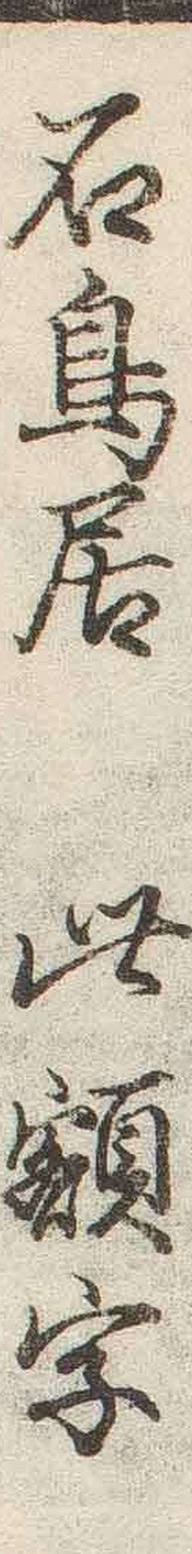石鳥居此額字
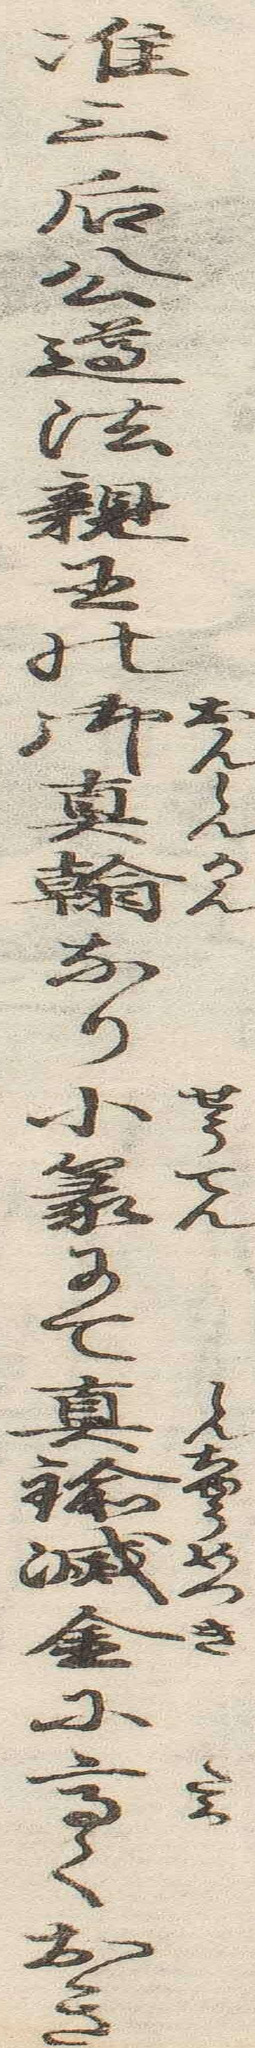准三后公遵法親王の御真翰なり小篆にて真鍮滅金に高くおき
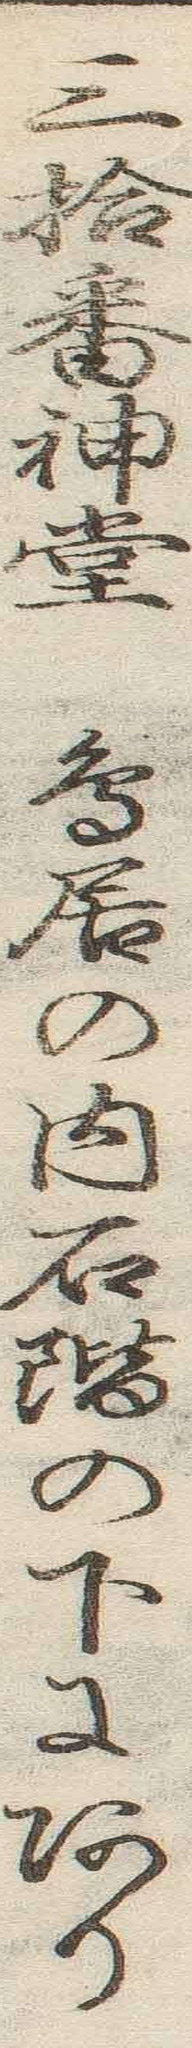三拾番神堂鳥居の内石階の下にあり
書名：日光山志
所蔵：東京学芸大学附属図書館 国文学研究資料館
